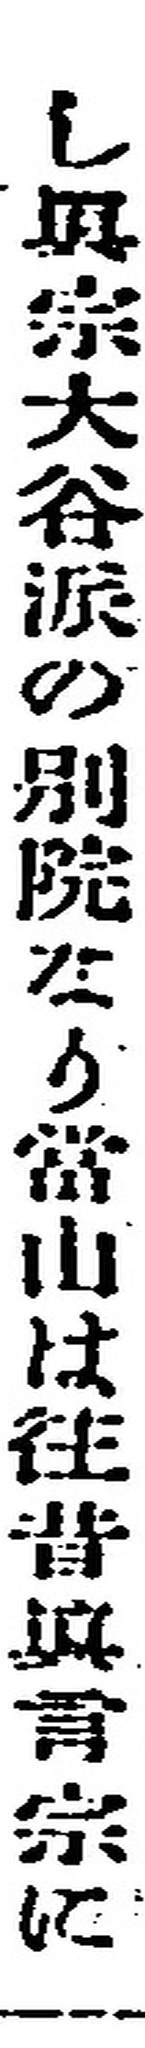し真宗大谷派の別院なり当山は往昔真言宗に
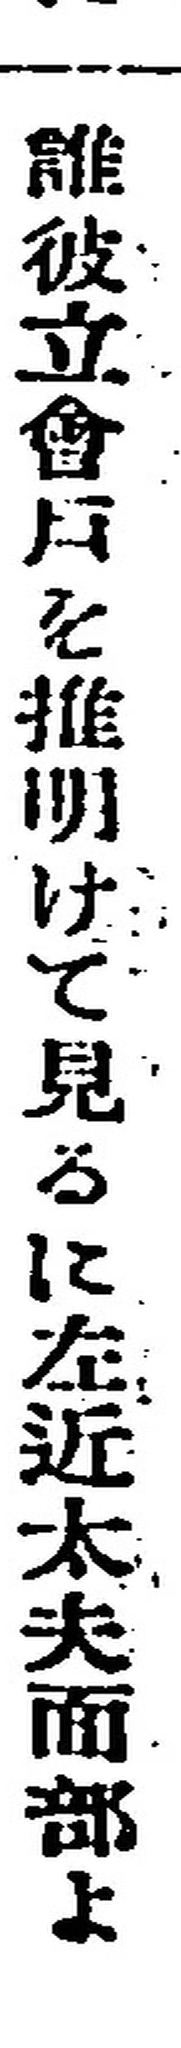誰彼立会戸を推明けて見るに左近太夫面部よ
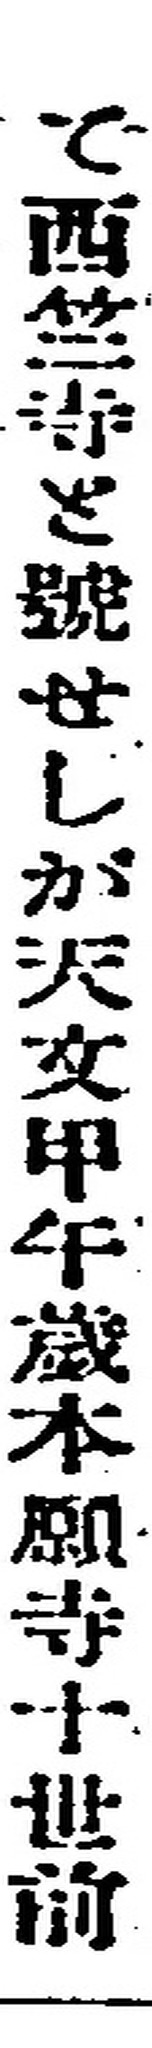て西竺寺と号せしが天文甲午歳本願寺十世前
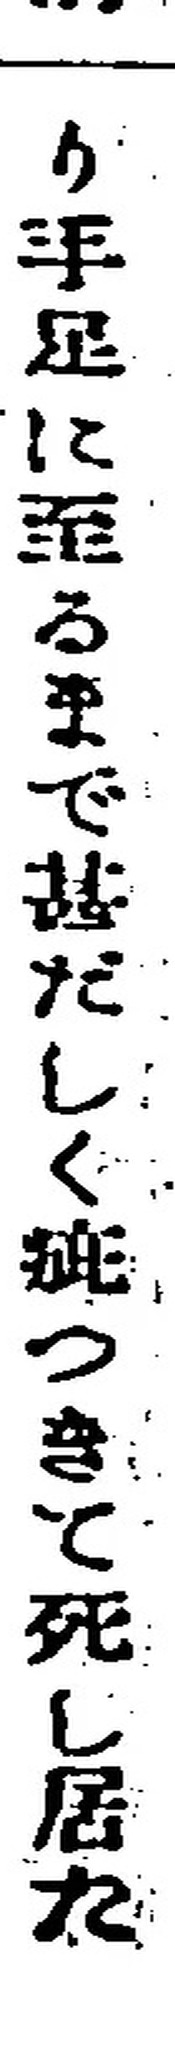り手足に至るまで甚だしく疵つきて死し居た
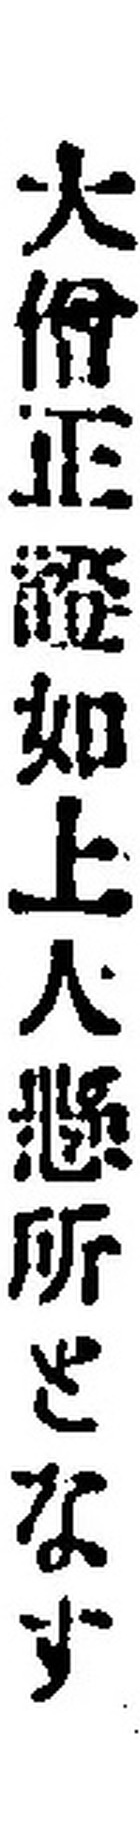大僧正証如上人懸所となす
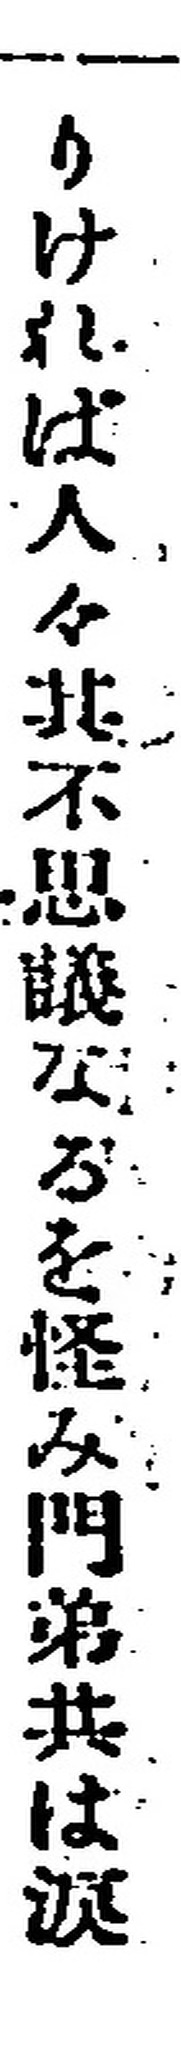りければ人々其不思議なるを怪み門弟共は涙
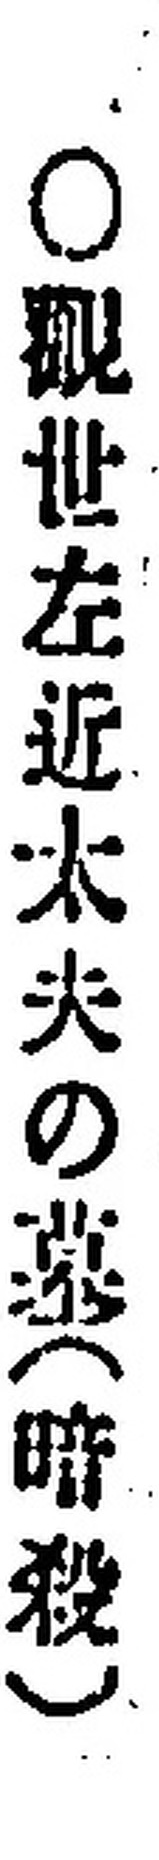○観世左近太夫の墓(暗殺)
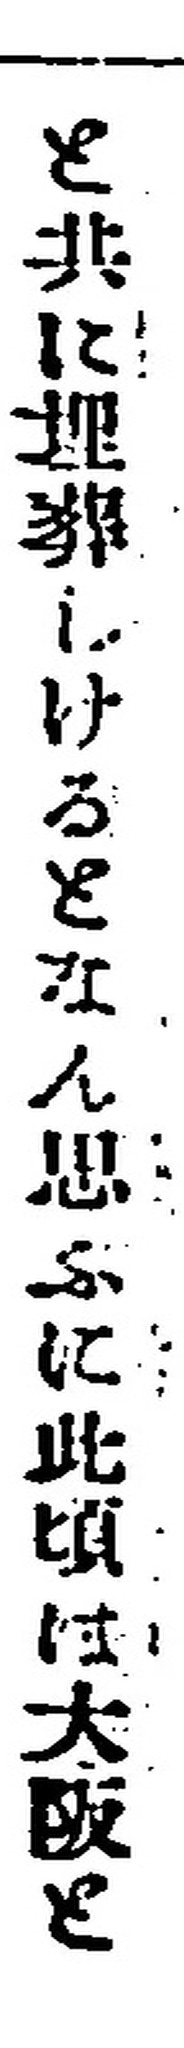と共に埋葬しけるとなん思ふに此頃は大阪と
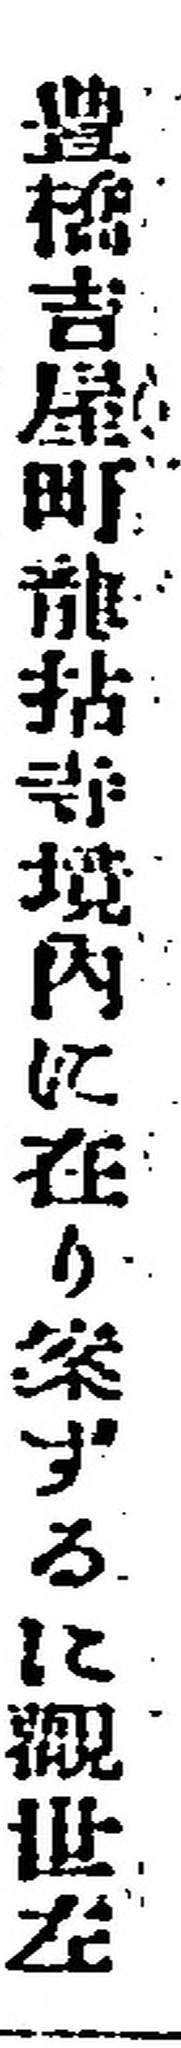豊橋吉屋町龍拈寺境内に在り案ずるに観世左
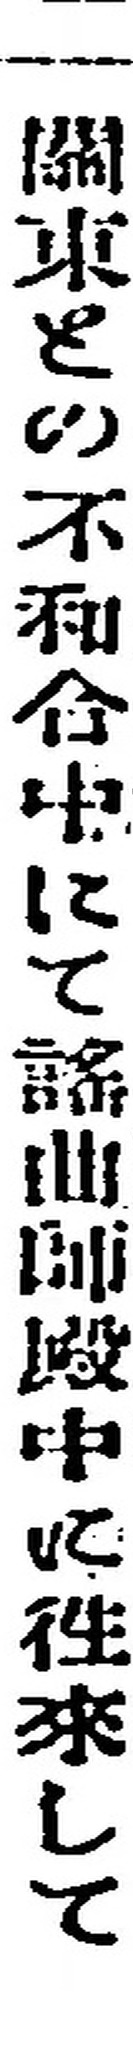関東との不和合中にて謡曲師殿中に往来して
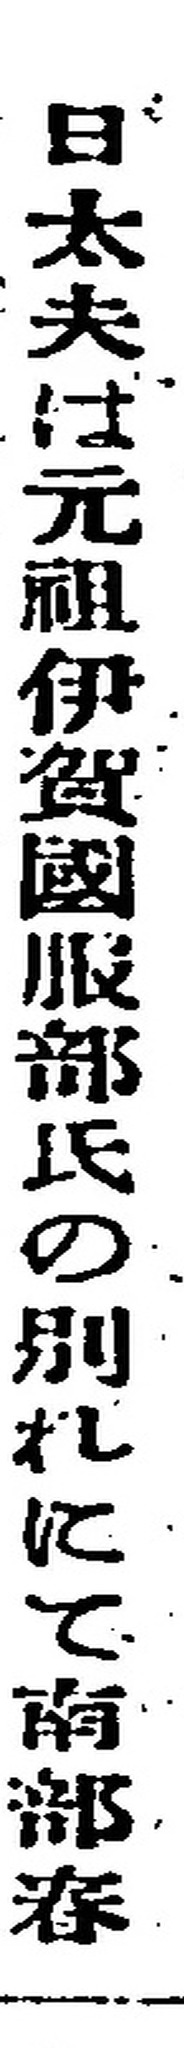日太夫は元祖伊賀国服部氏の別れにて南部春
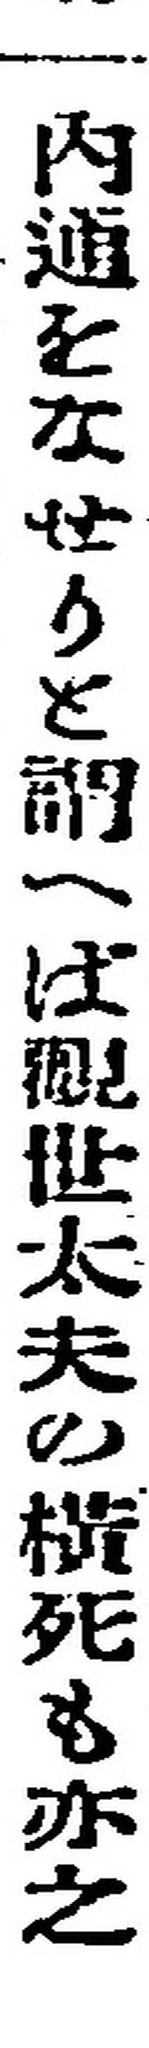内通をなせりと謂へば観世太夫の横死も亦之
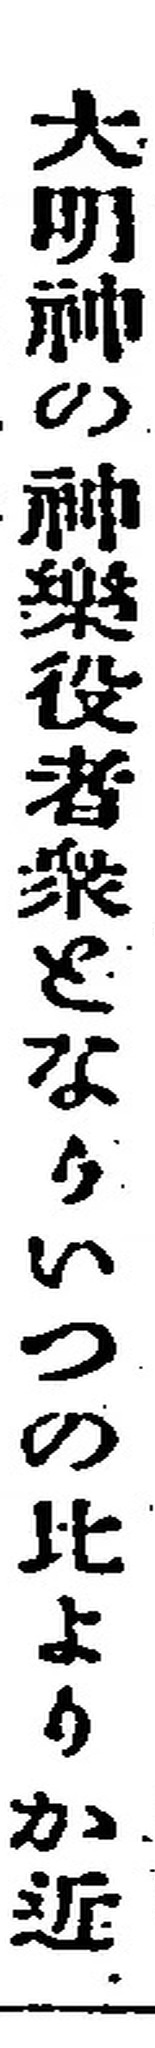大明神の神楽役者衆となりいつの比よりか近
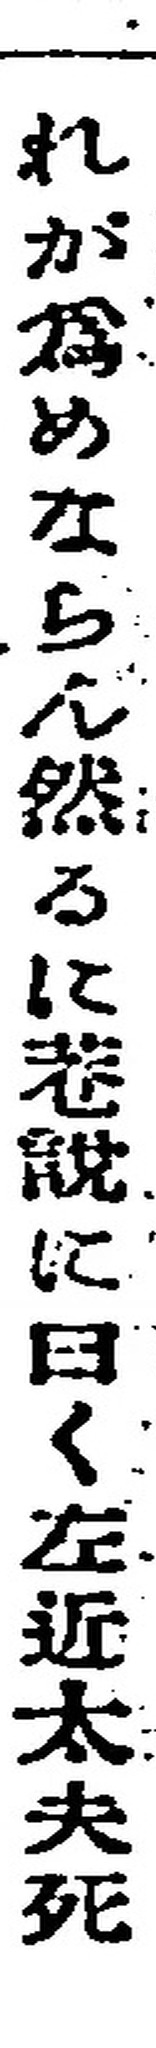れが為めならん然るに巷説に曰く左近太夫死
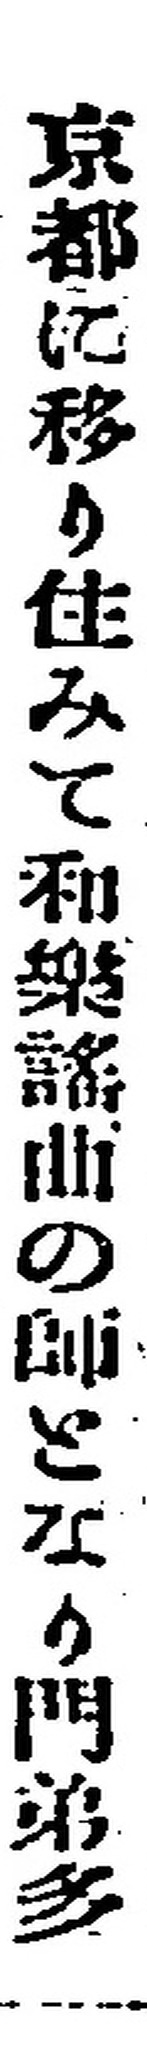京都に移り住みて和楽謡曲の師となり門弟多
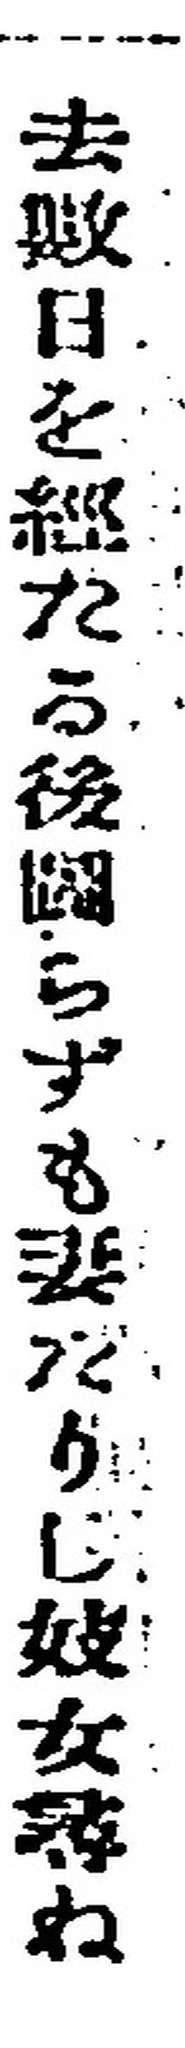去数日を経たる後図らずも妻たりし妓女尋ね
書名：東参名勝案内
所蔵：国立国会図書館 National Diet Library, JAPAN
